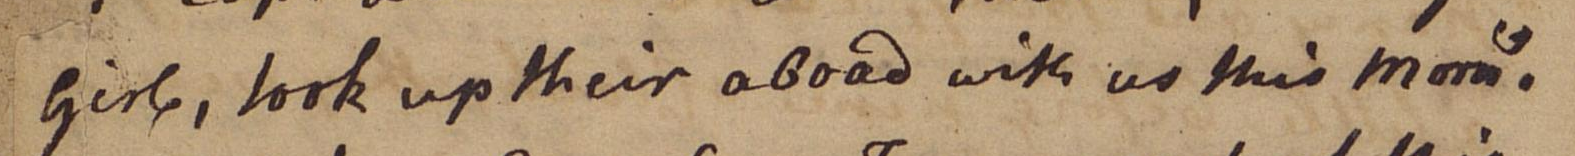Girl, took up their aboad with us this morn^g.
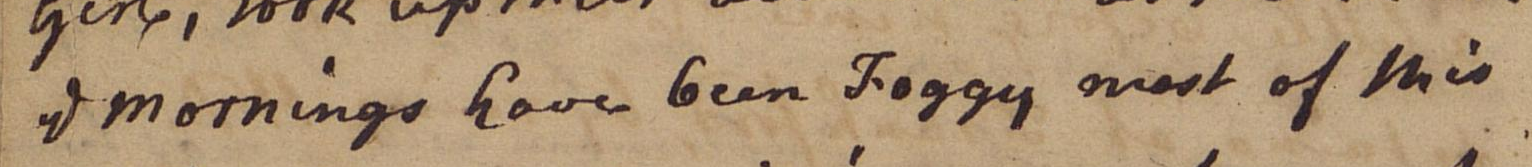y^e Mornings have been Foggy most of this
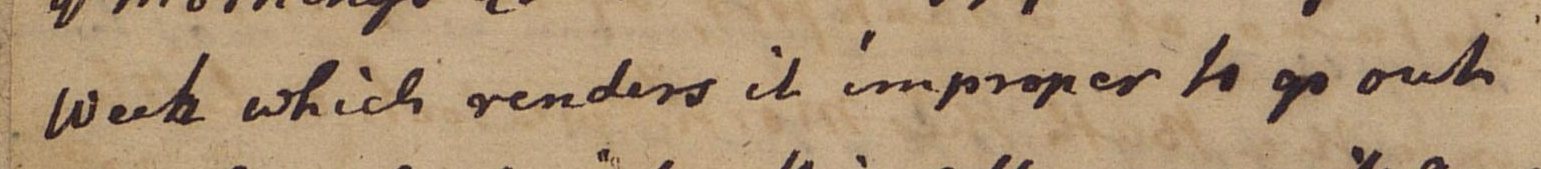week which renders it improper to go out
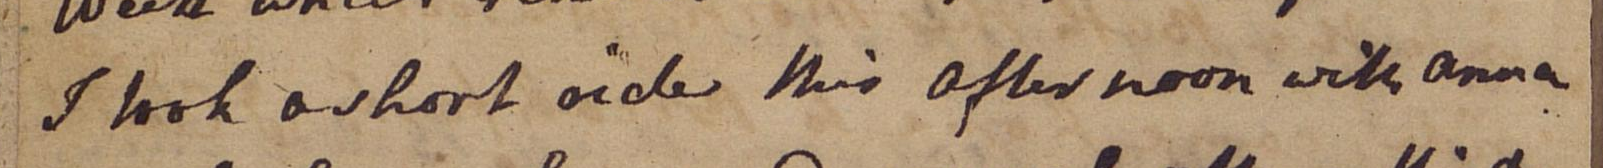I took a short ride this afternoon with Anna
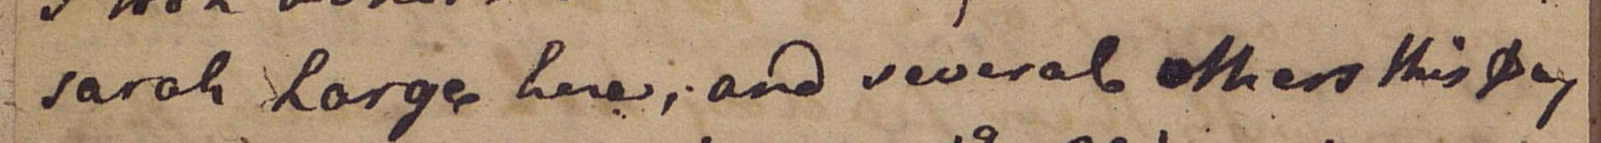Sarah Large here, and several others this Day
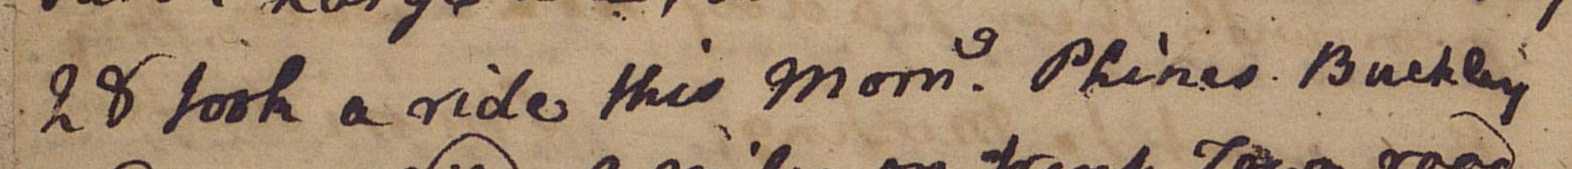28 took a ride this Morn^g. Phines. Buckley
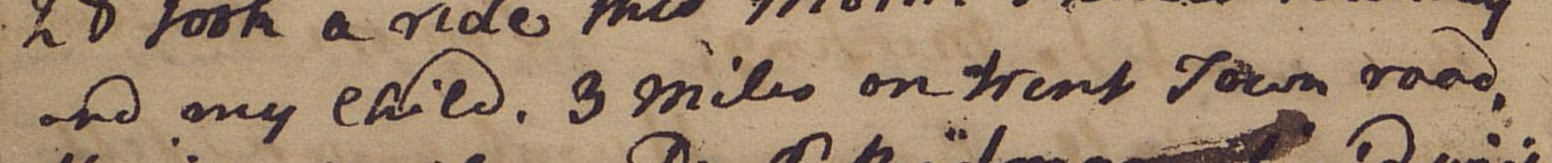and my child, 3 miles on trent Town road
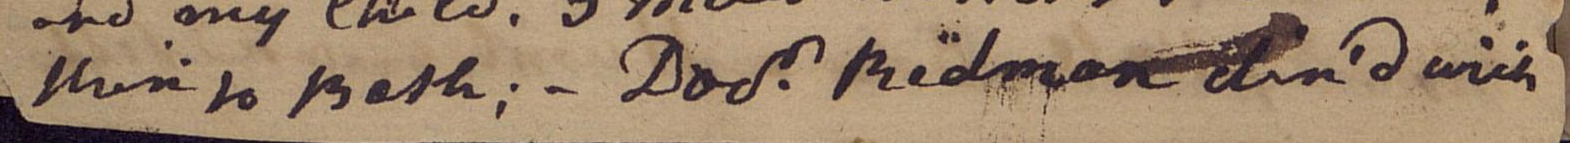then to Bath;- Doc^r. Redman din'd with
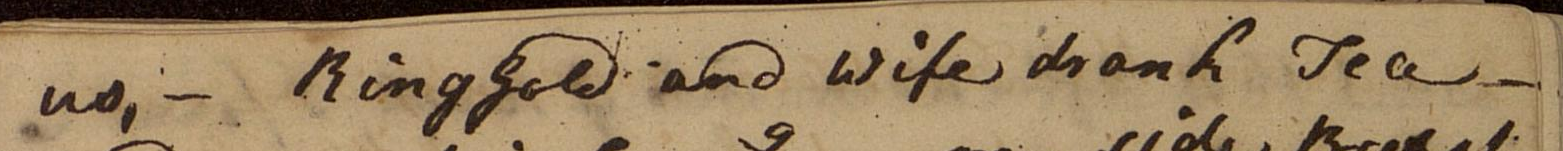us,- Ring Gold and wife drank Tea-
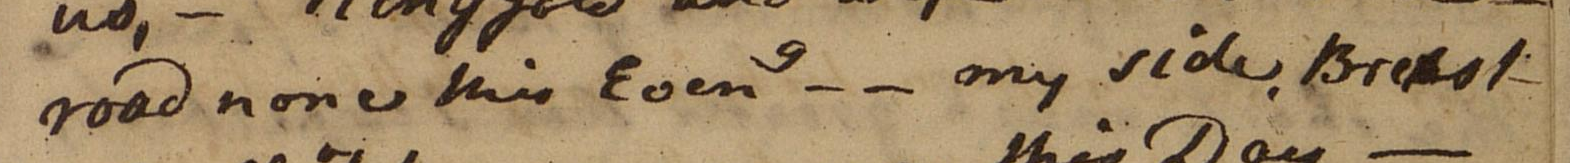road none this Even^g-- my side Breast
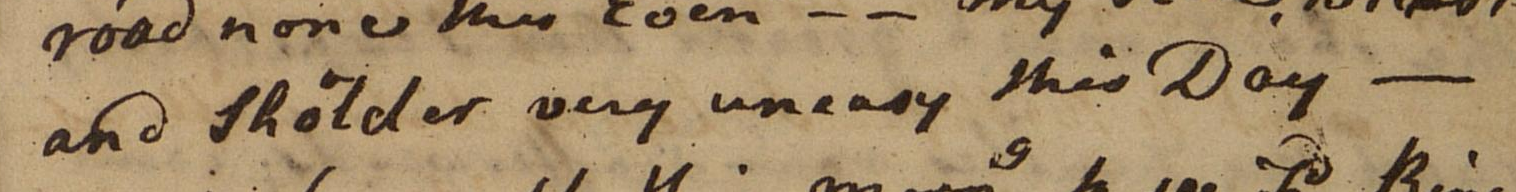and Sho^u lder very uneasy this Day-
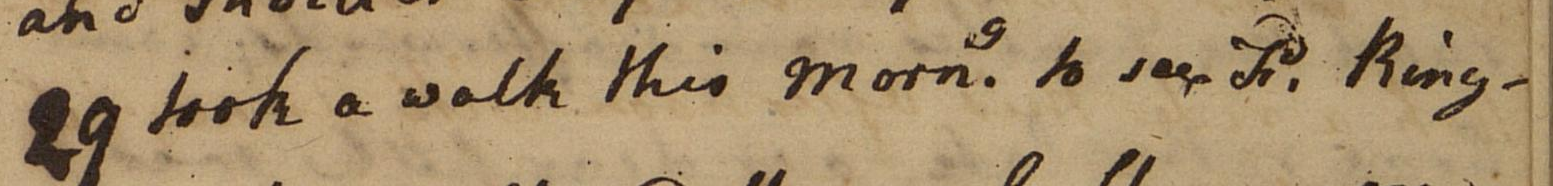29 took a walk this morn^g. to see Fr^d. Ring-
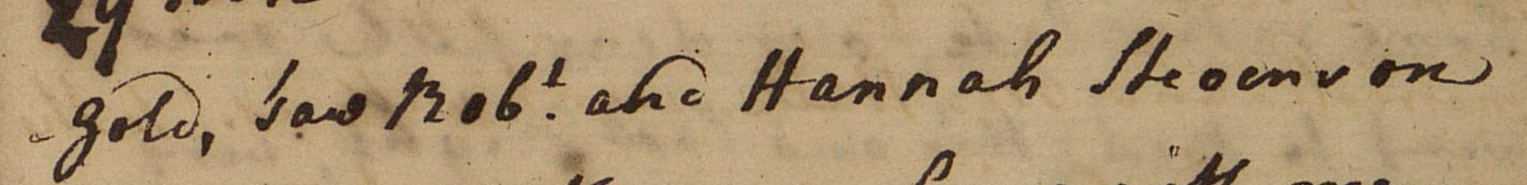-gold, saw Rob^t. and Hannah Stevenson
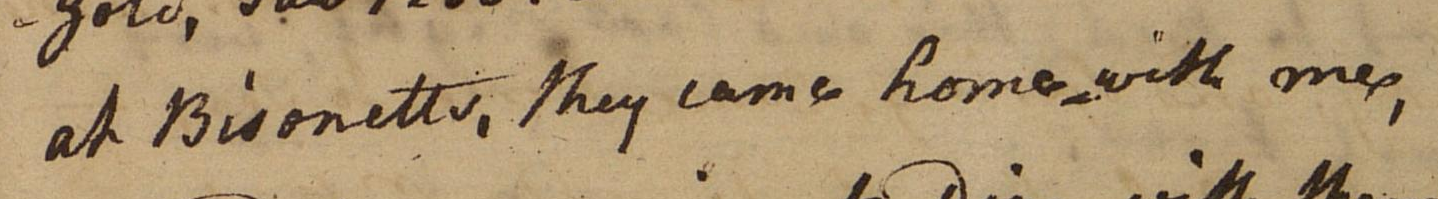at Bisonetts, they came home with me,
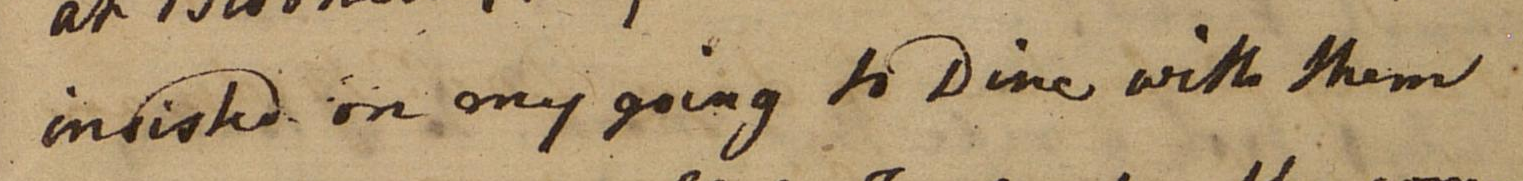insisted on my going to Dine with them
